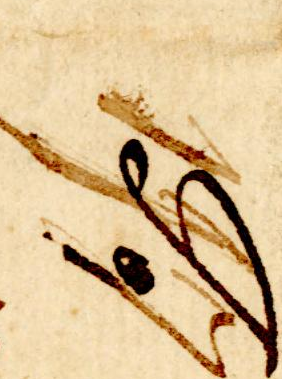To
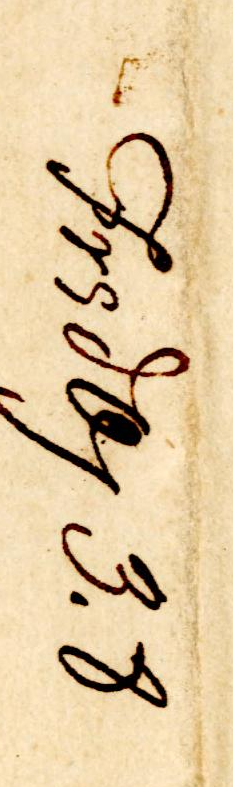Frsdg 3. 8
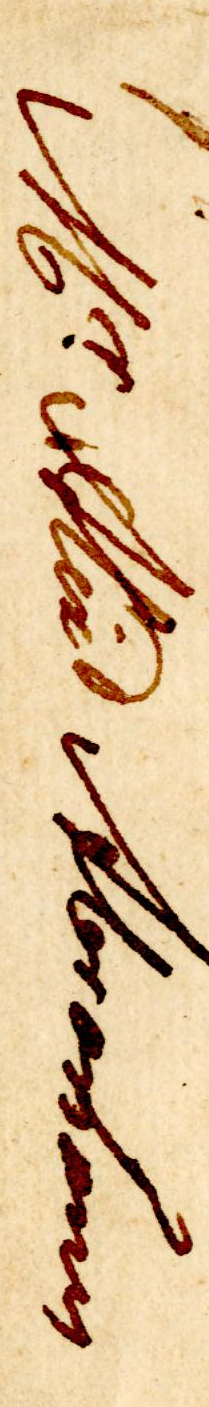M^r Alex^d Abraham
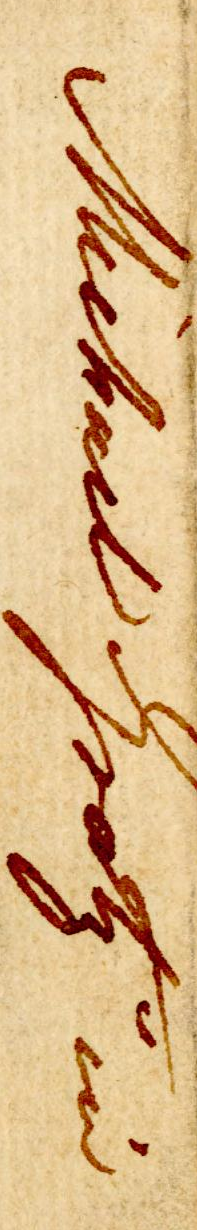Michael Gratz in
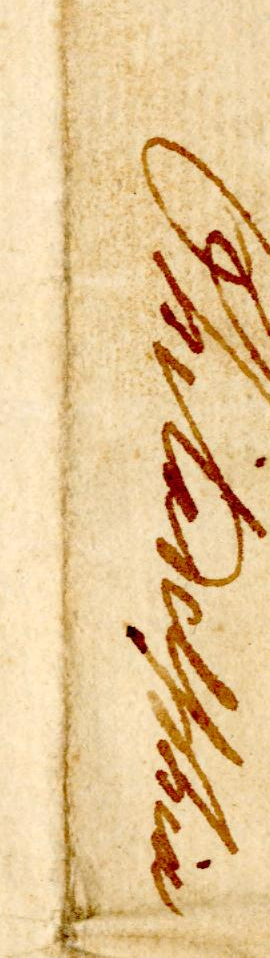Philadelphia
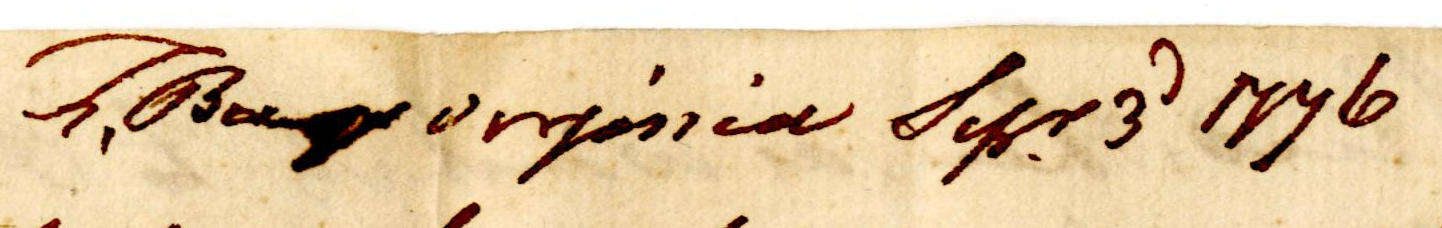F.burg virginia Sep^r. 3^d 1776
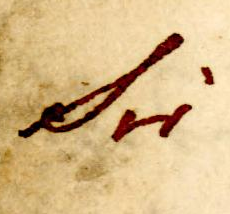Sir,
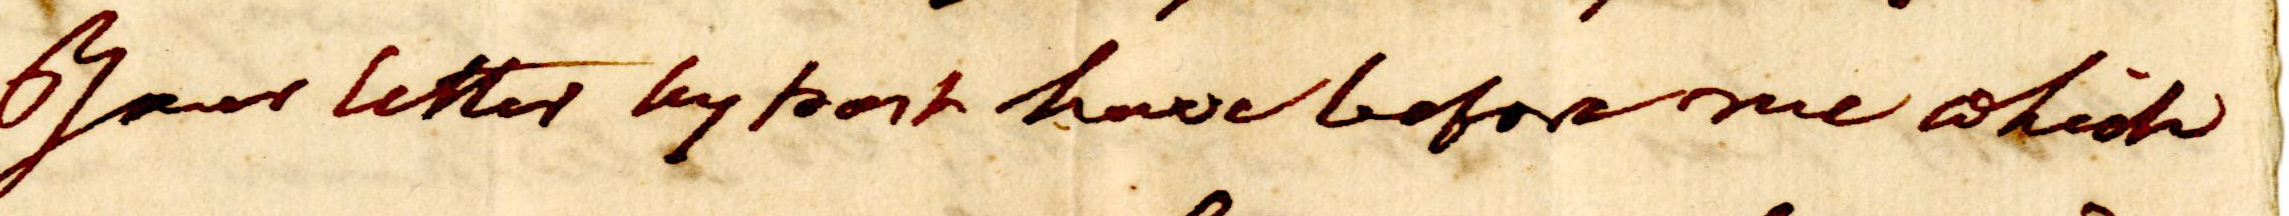Your letter by post have before me which
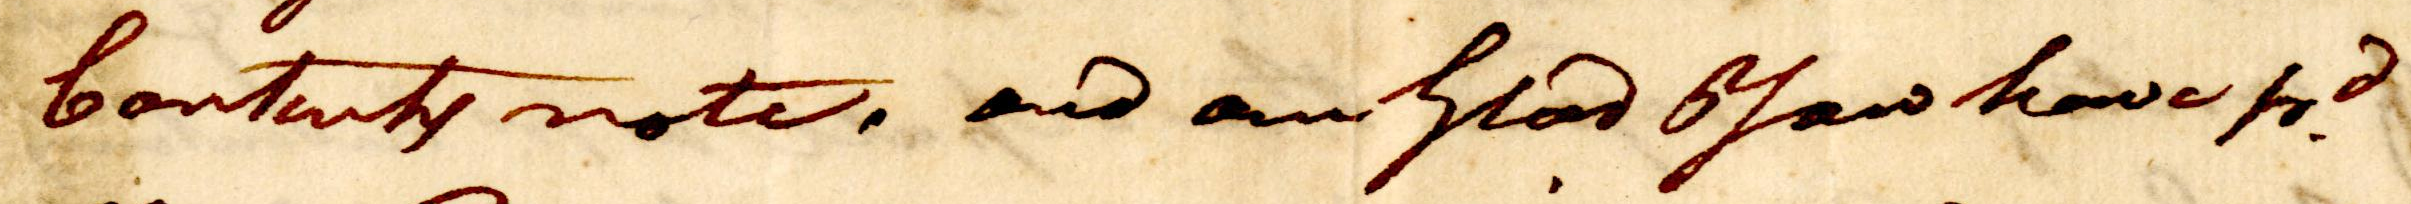Contents note, and am Glad you have p^d.
